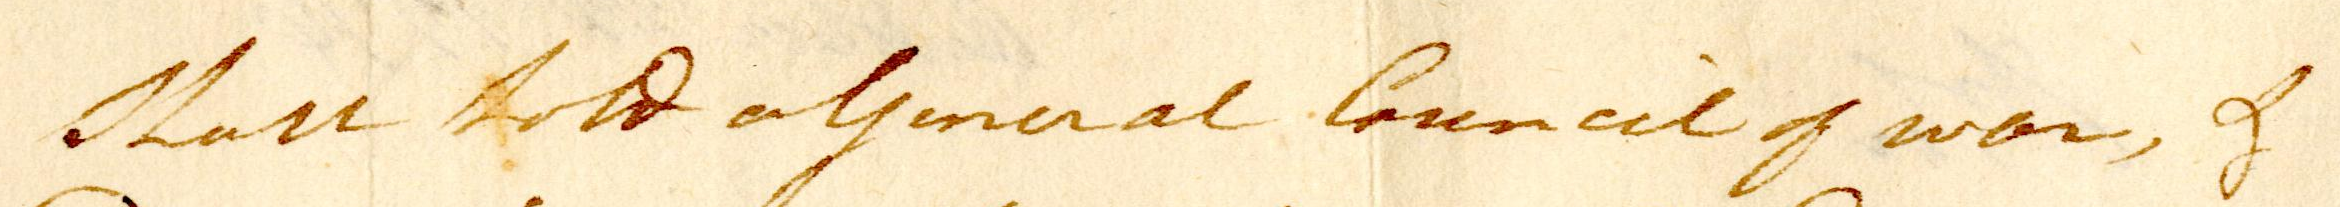shall hold a General Council of war, &
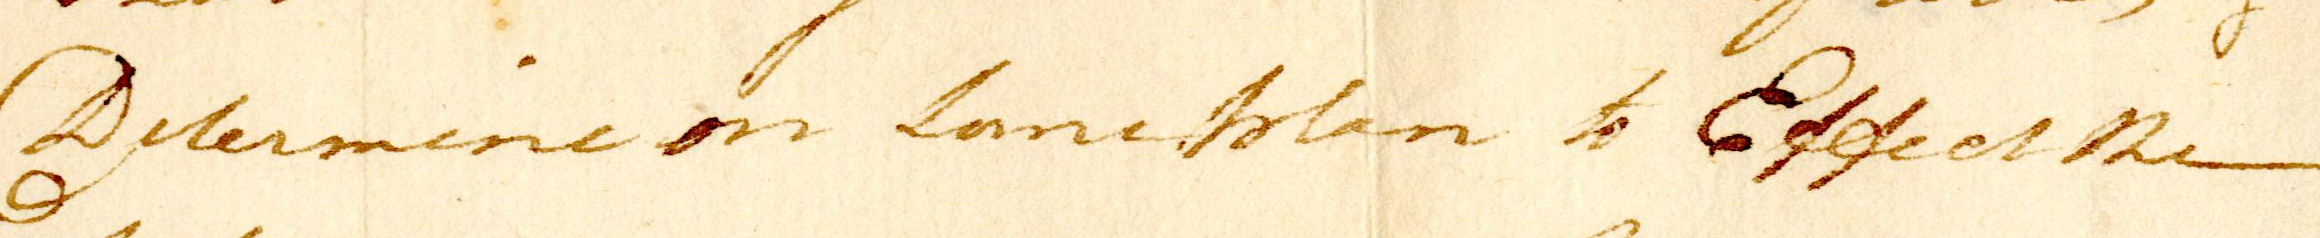Determine on Laneplan to Effect the
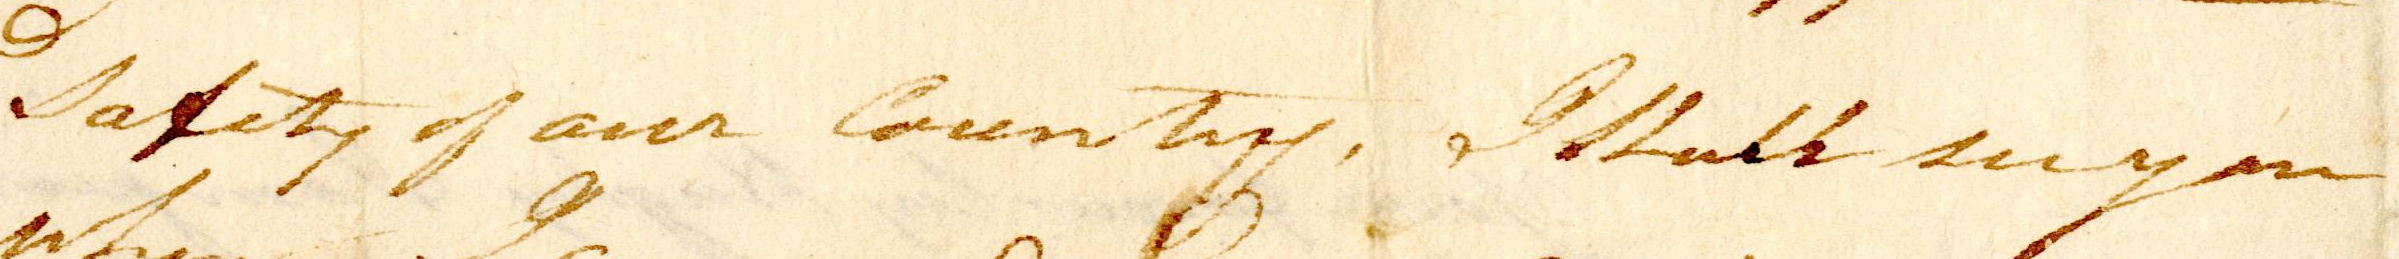Safety of our Country, I shall see you
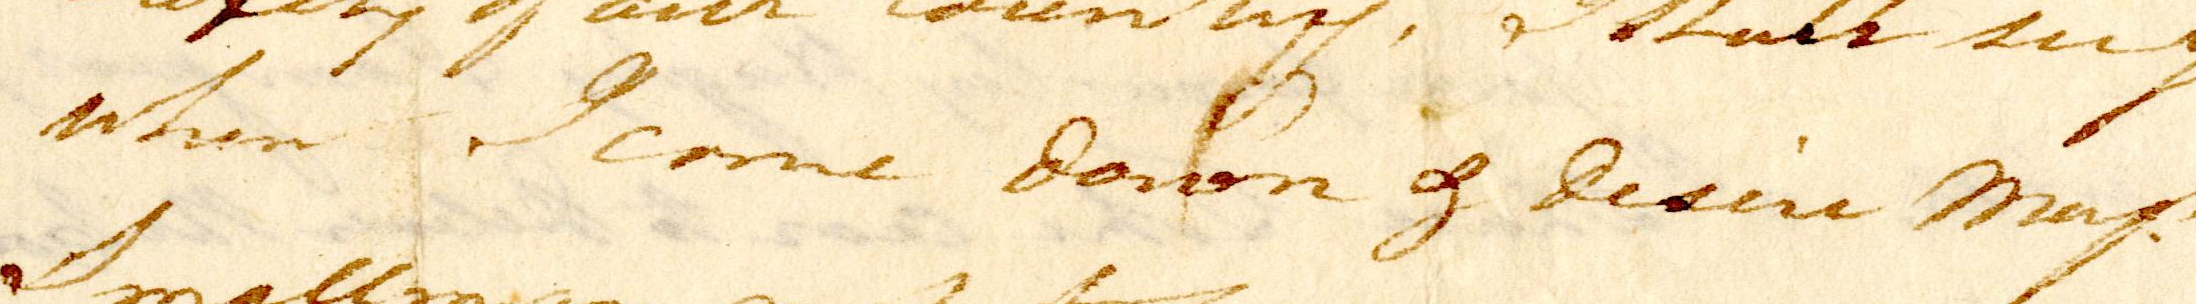when I come down & Desere Maj^r
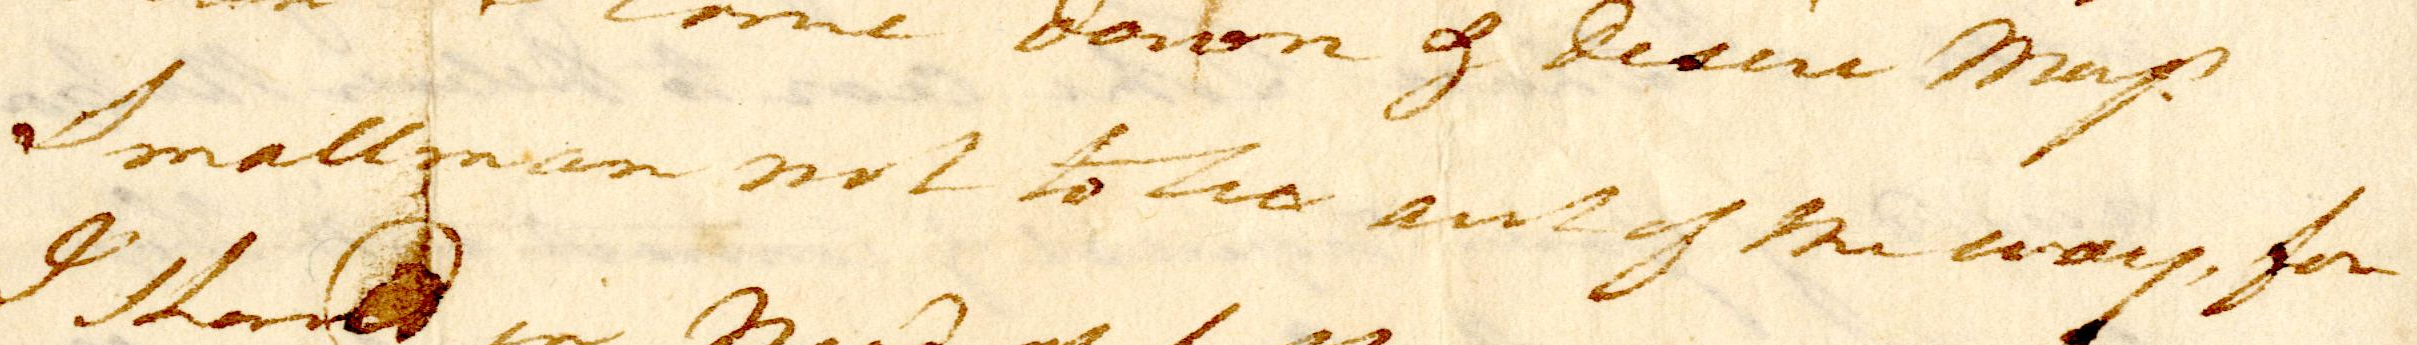Smallman not to be out of the way, for
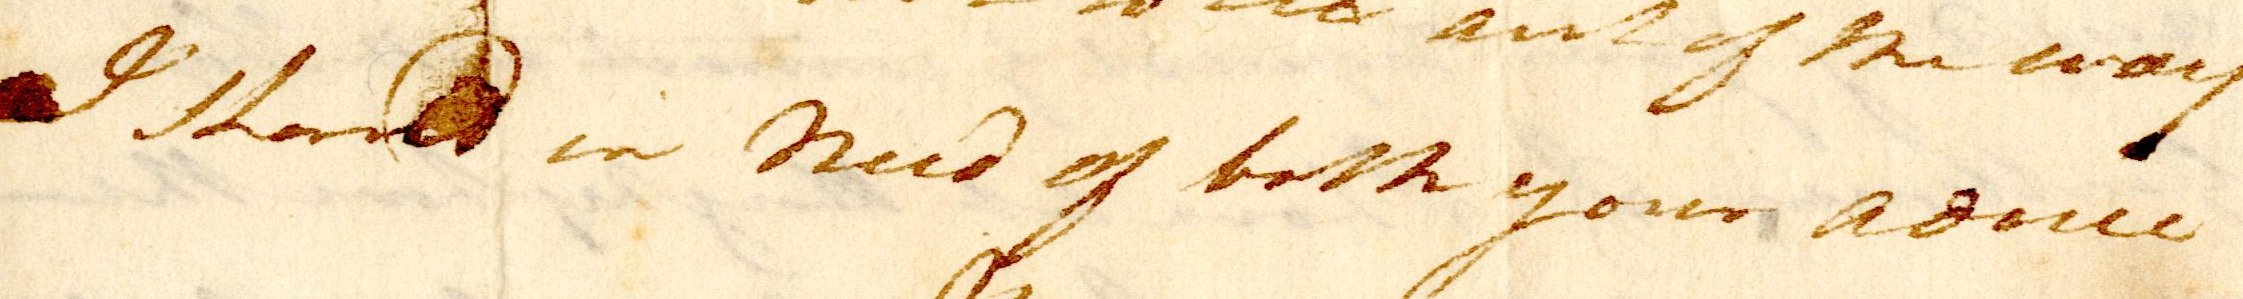I should in Need of both your advice
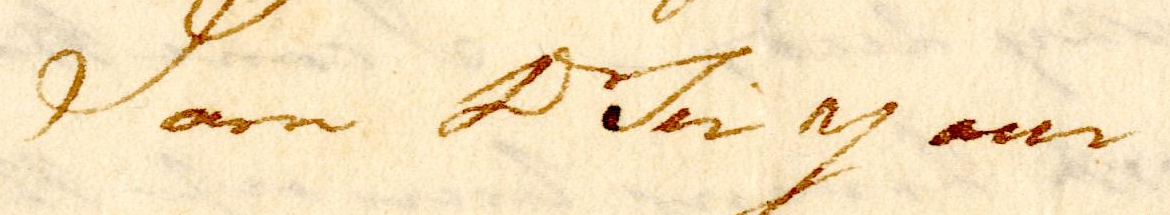I am D^r sir your
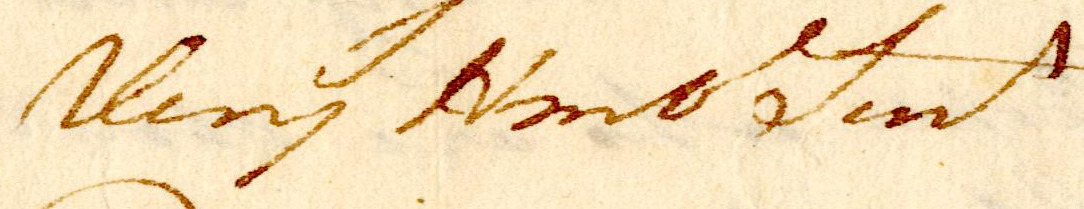very Hmb^l Ser^t
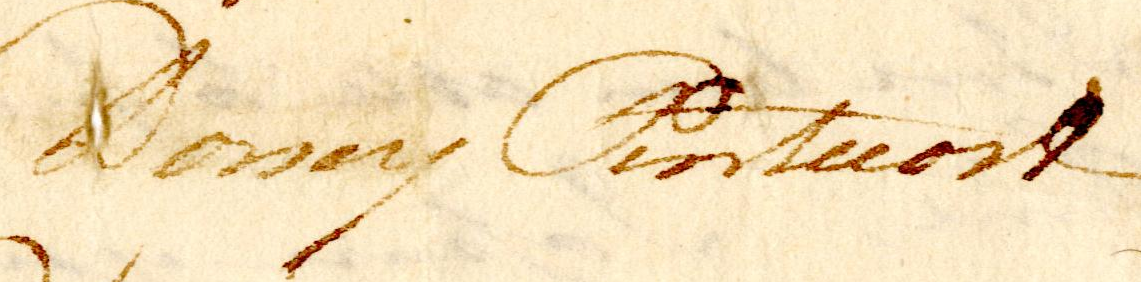Doney Pintuort
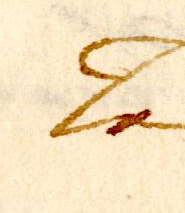to
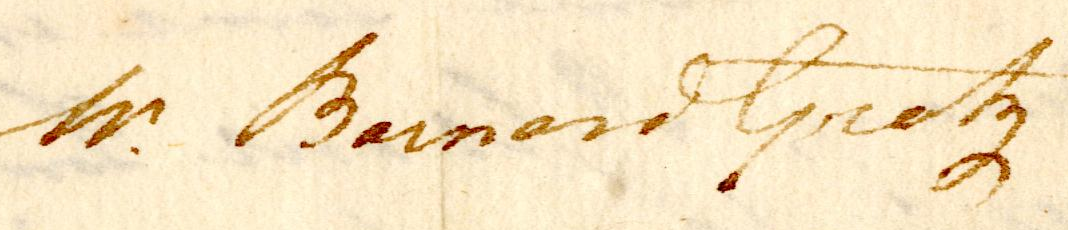M^r. Barnard Gratz
